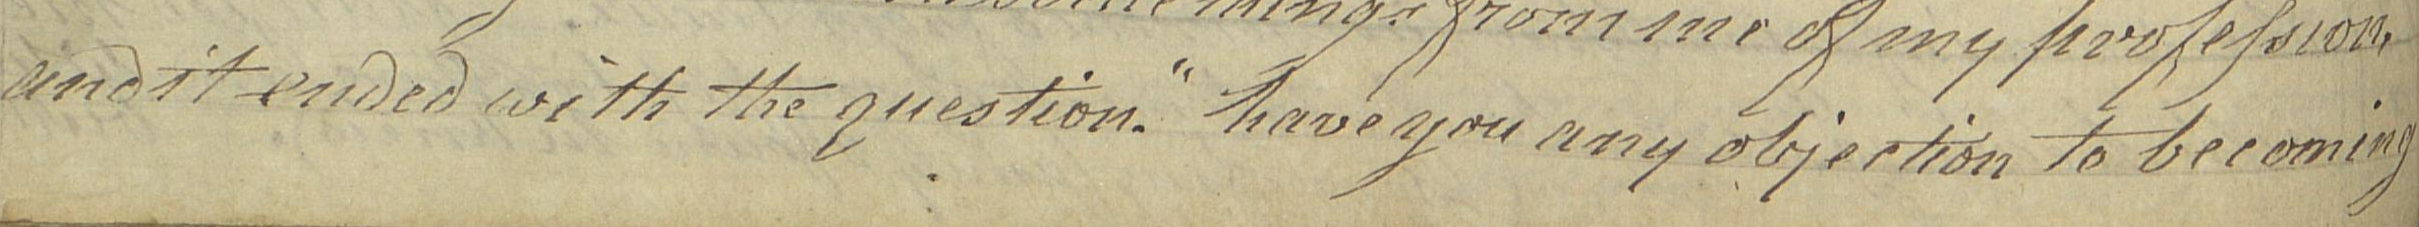and it ended with the question. "have you any objection to becoming
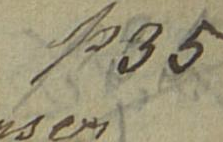p 35
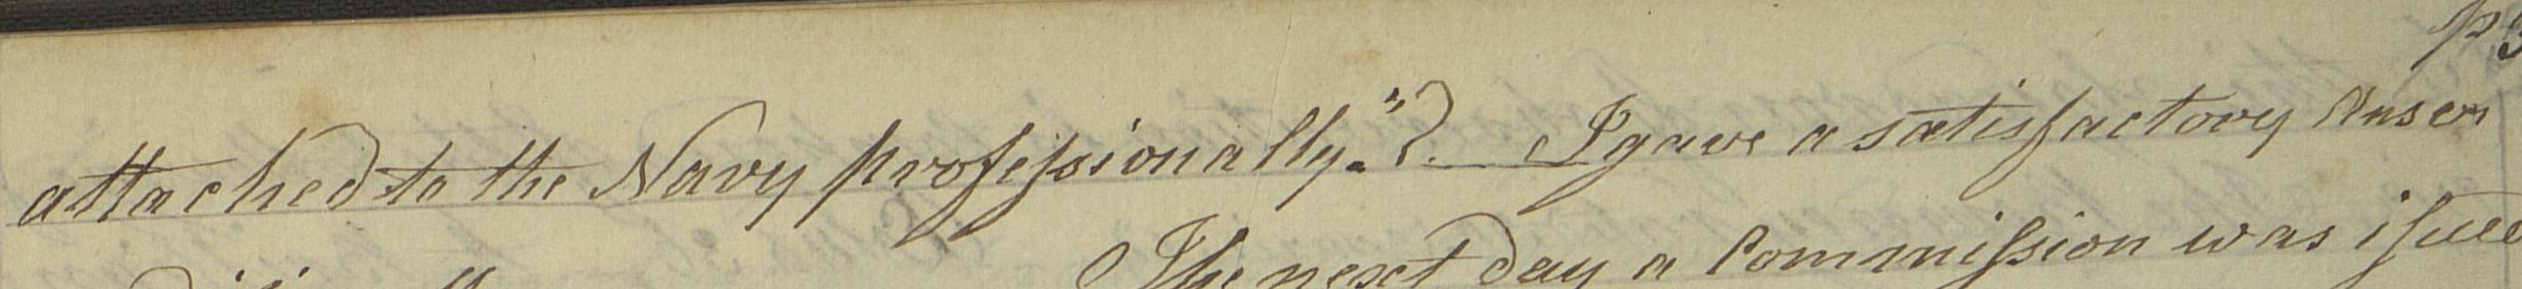attached to the Navy profesionally"? I gave a satisfactory Anser
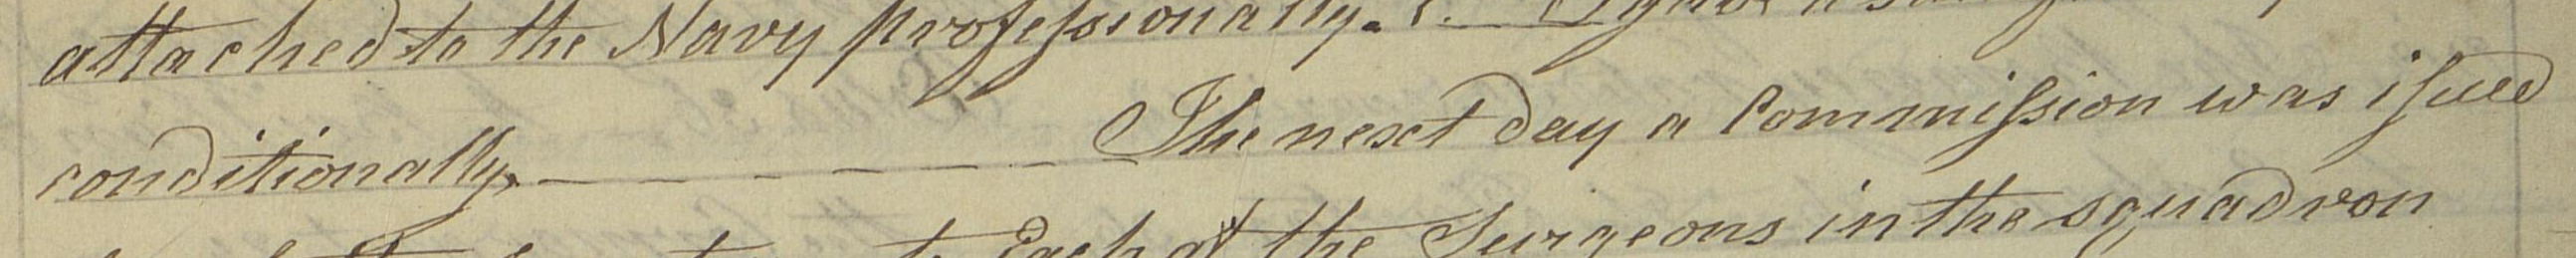conditionally, The next day a Commission was issued
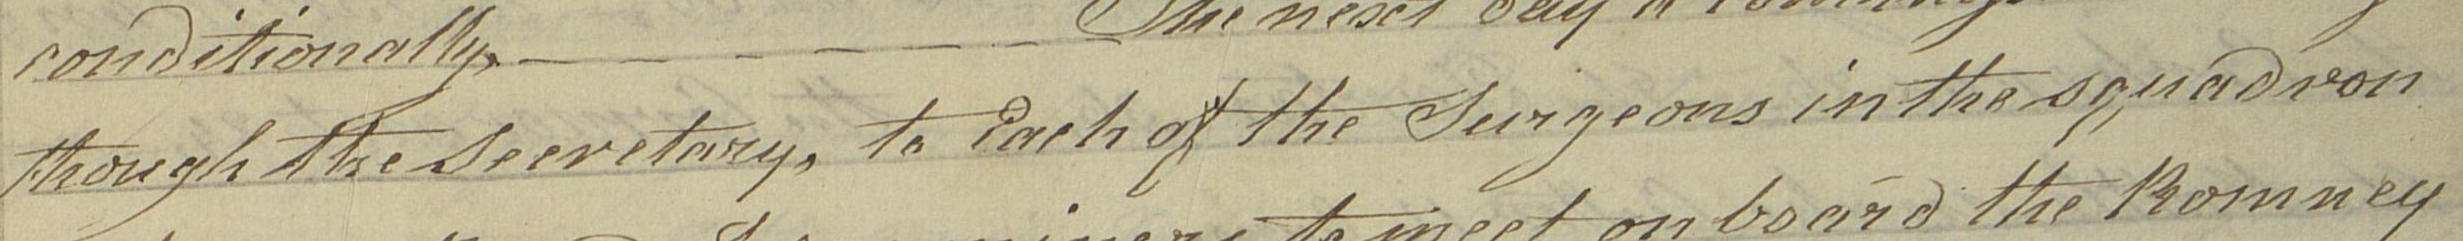though the secretary, to Each of the Surgeons in the squadron
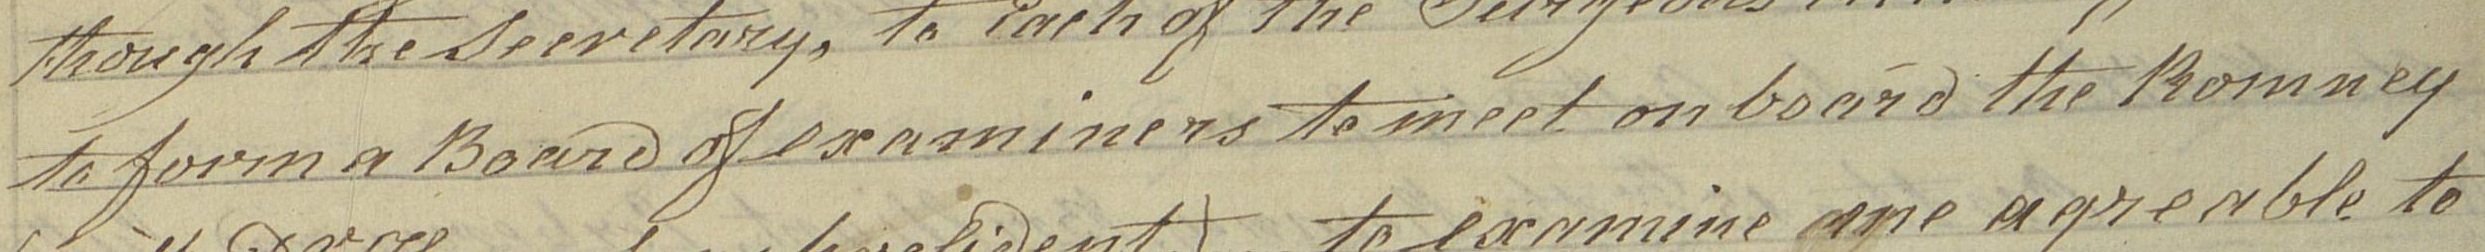to form a Board of examiners to meet on board the Romney
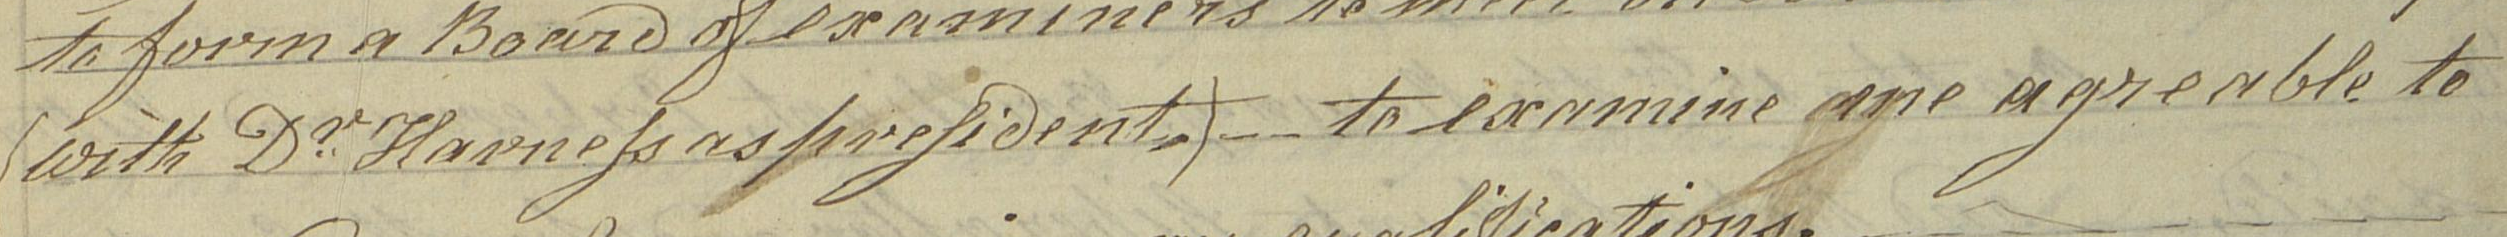(with D^r. Harness as president.) to examine me agreable to
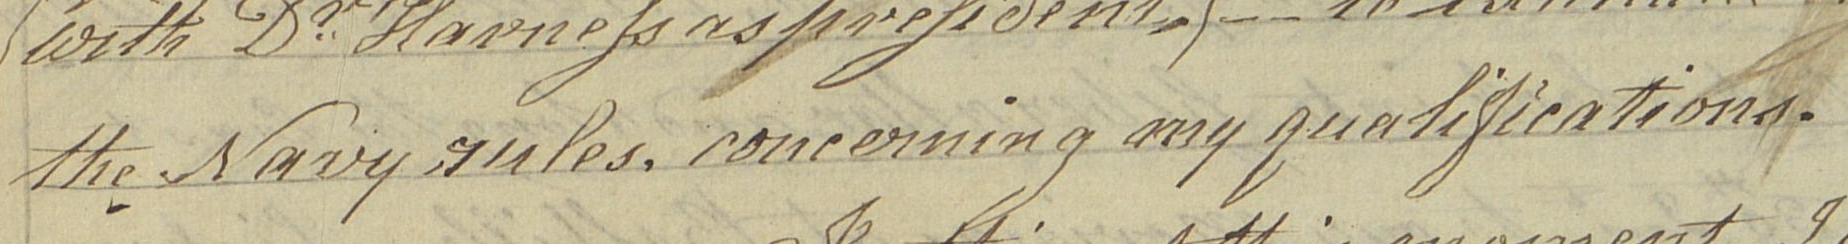the Navy rules. concerning my qualifications.
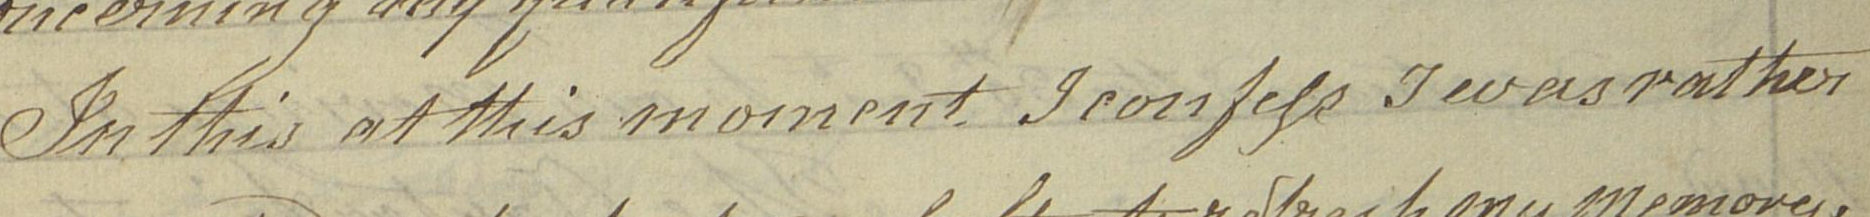In this at this moment I confess I was rather
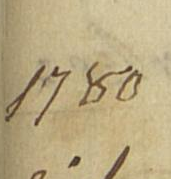1780
